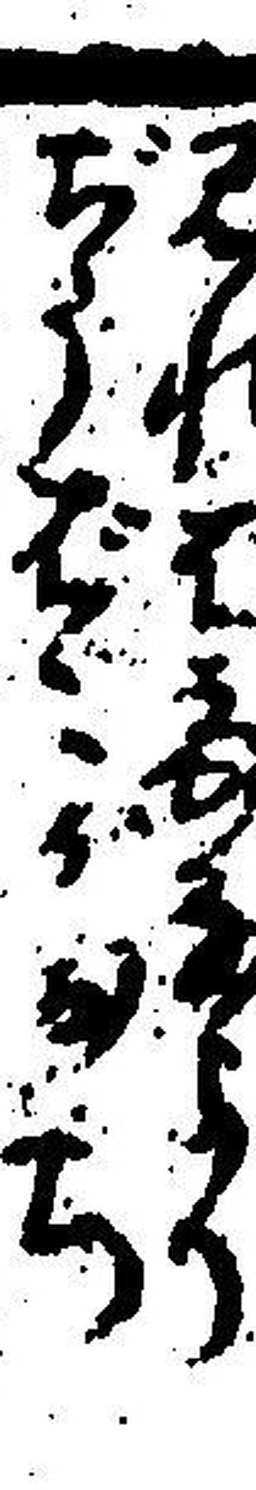ぢうばこがおち
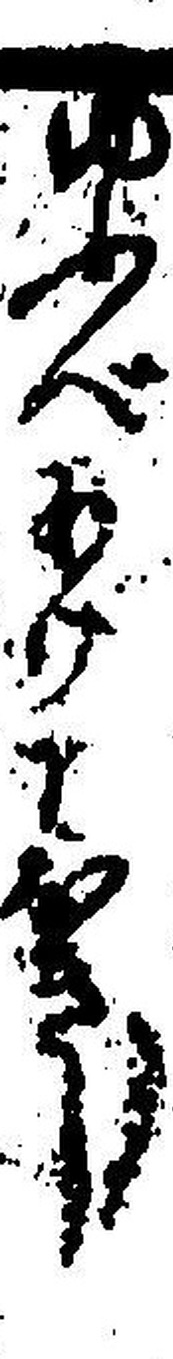ゆふべあけておきし
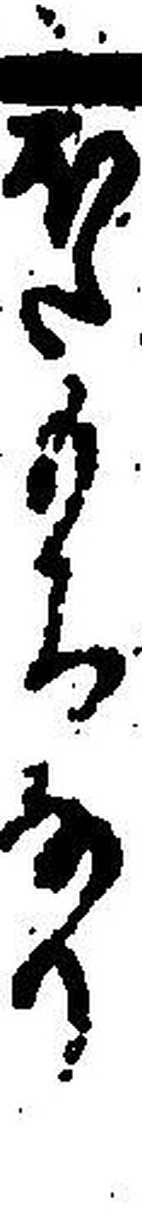ほたもちなり
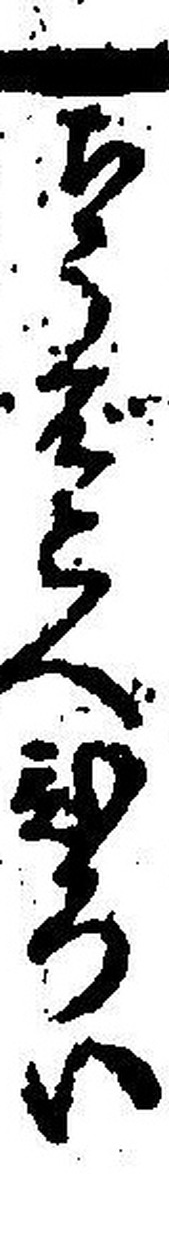ちばこへひろい
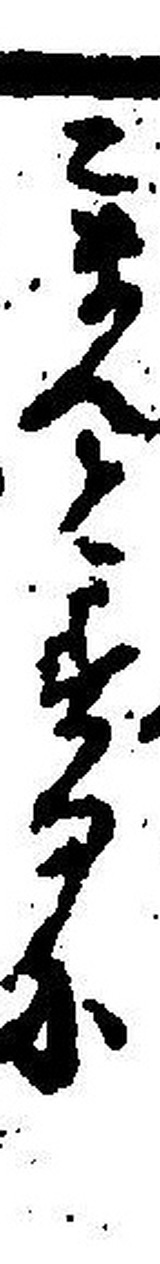こまんとするに
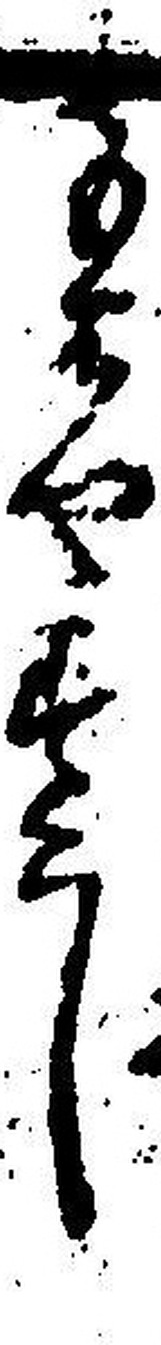もやはすこし
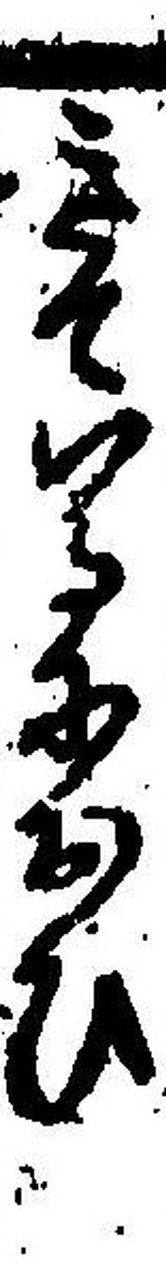きているにおひ
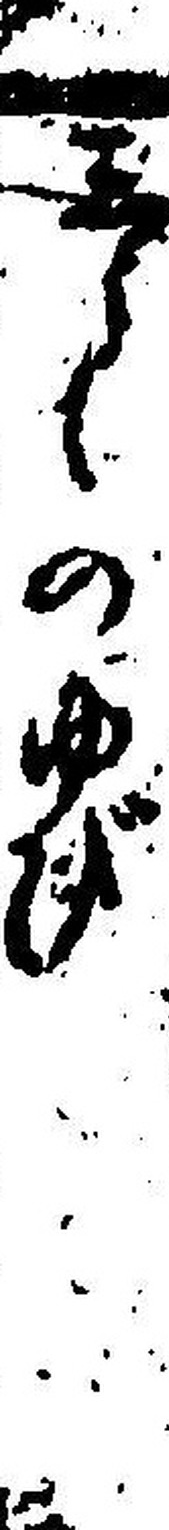しうしのゆび
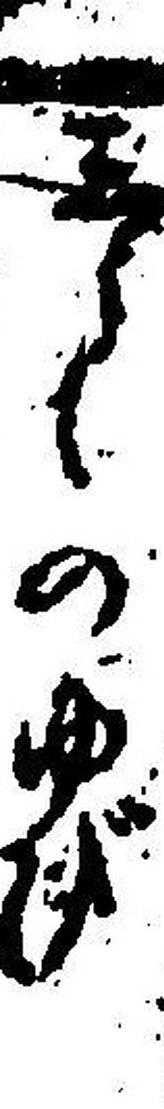しうしのゆび
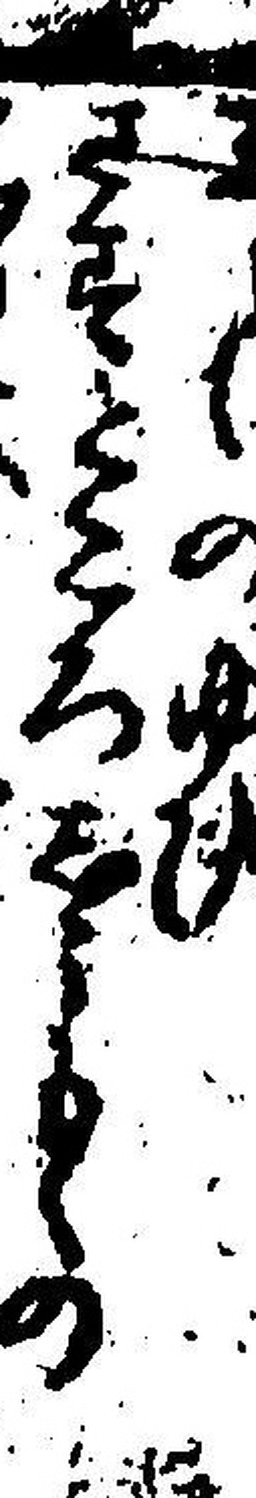さすところしうもくの
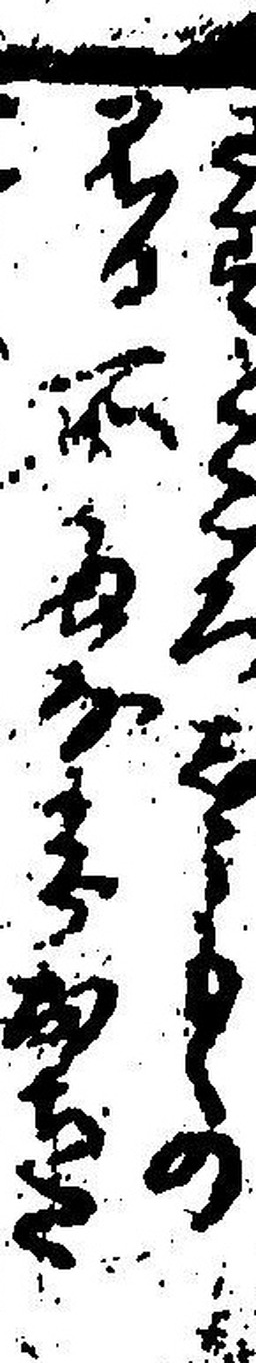見る所たなからおちた
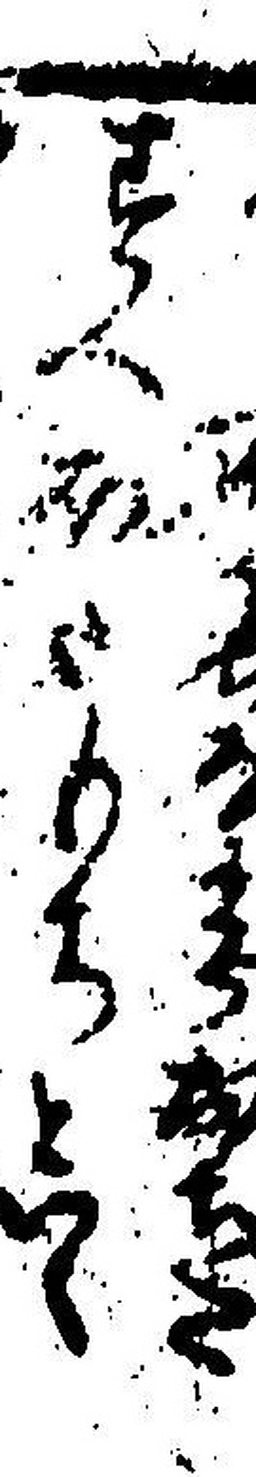すへほたもちといゝ
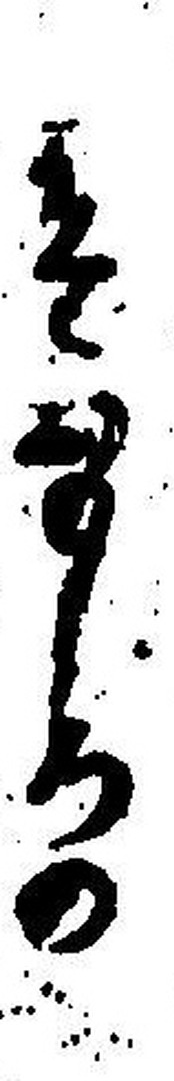はておもしろの
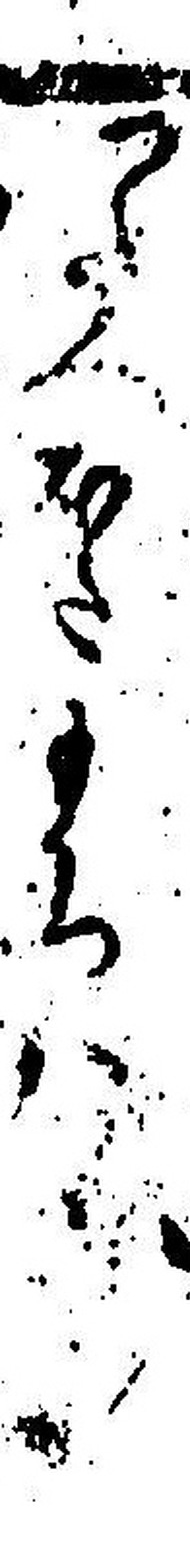つたへほたもちは
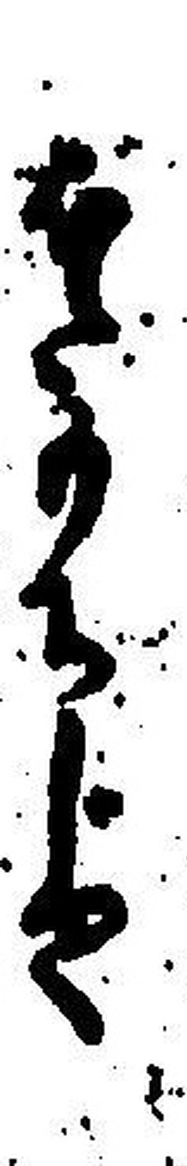ほたもちじや
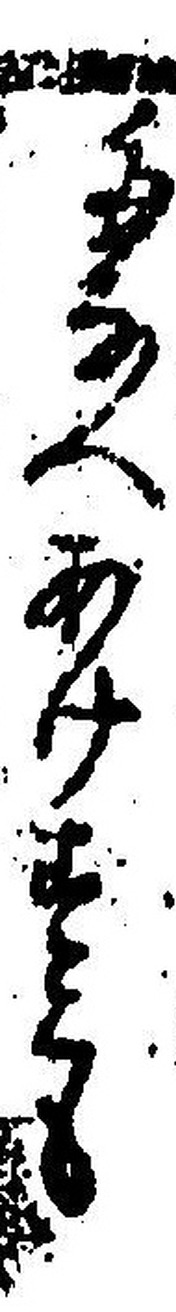たなへあけすとも
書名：牡丹餅棚有 / 市場通笑作
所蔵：東京大学総合図書館 General Library in the University of Tokyo, JAPAN
